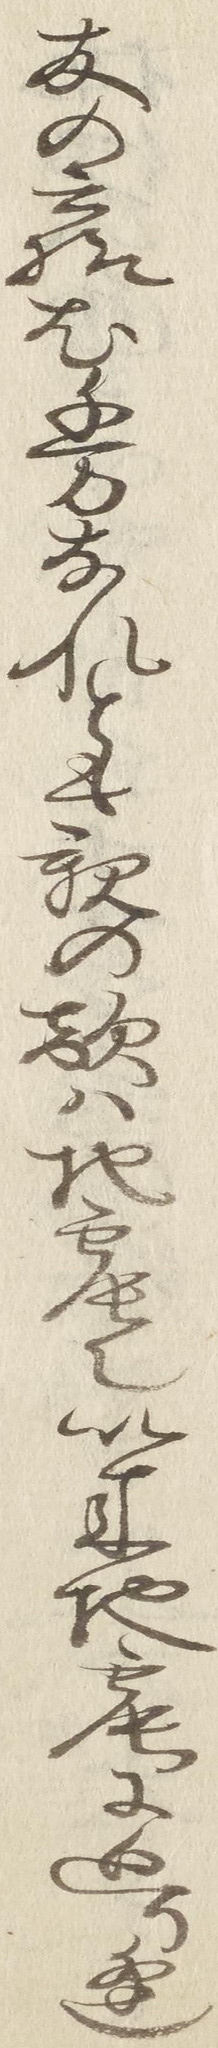友の云様尤千万なれとも親の敵は地震也以来地震に迫り遁
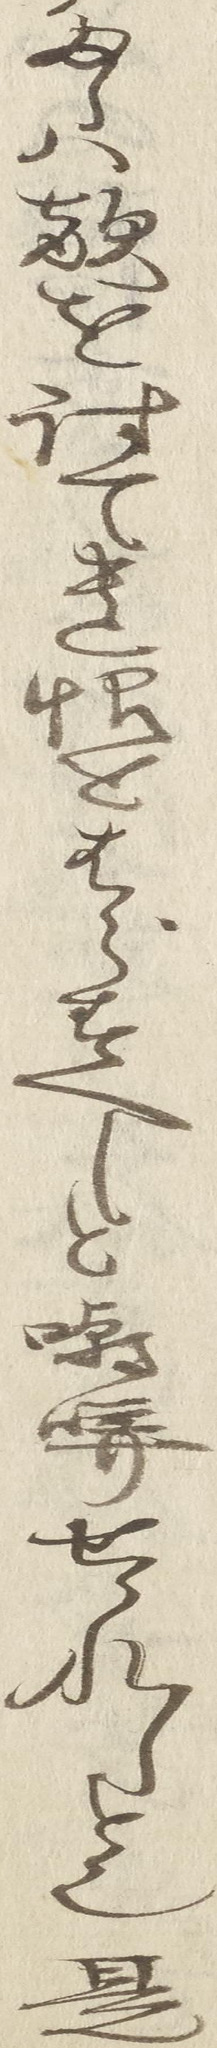たらは敵を討て遺恨をはらすへしと嘲哢せられしと也是
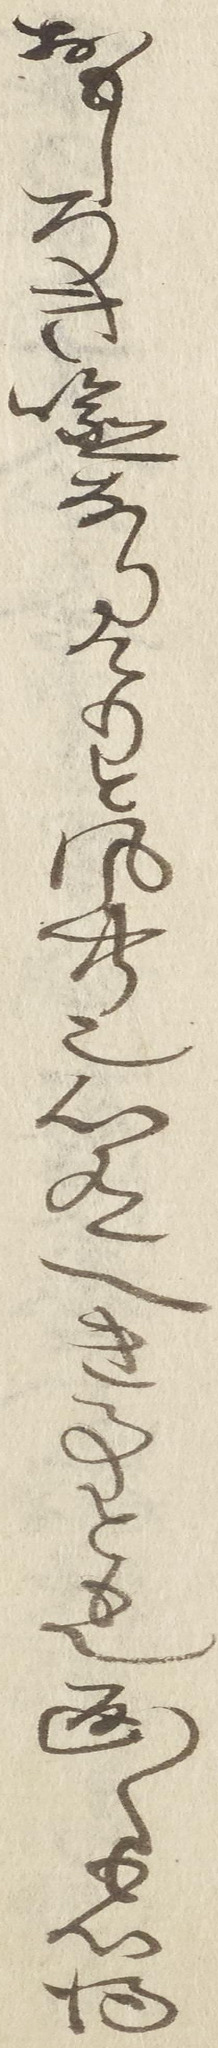おもしろき嘘なりけりと風聞也心有へき事とも也返々も心得
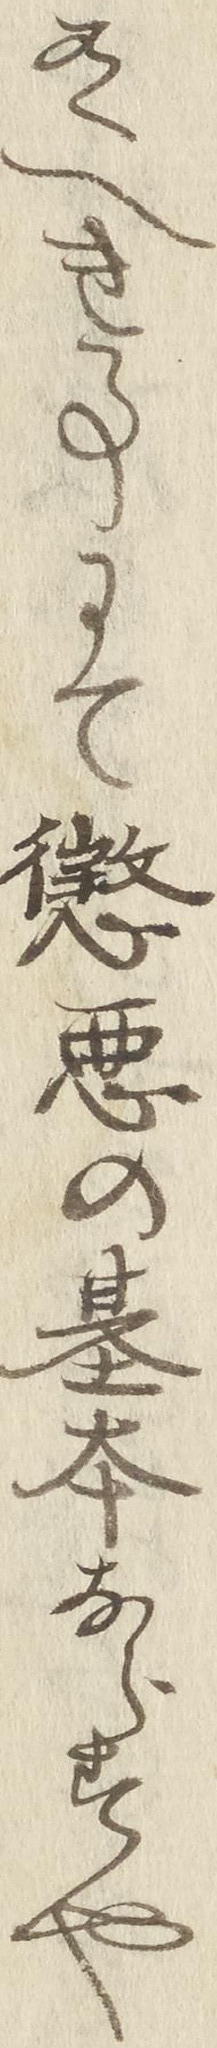有へき事にて懲悪の基本ならすや

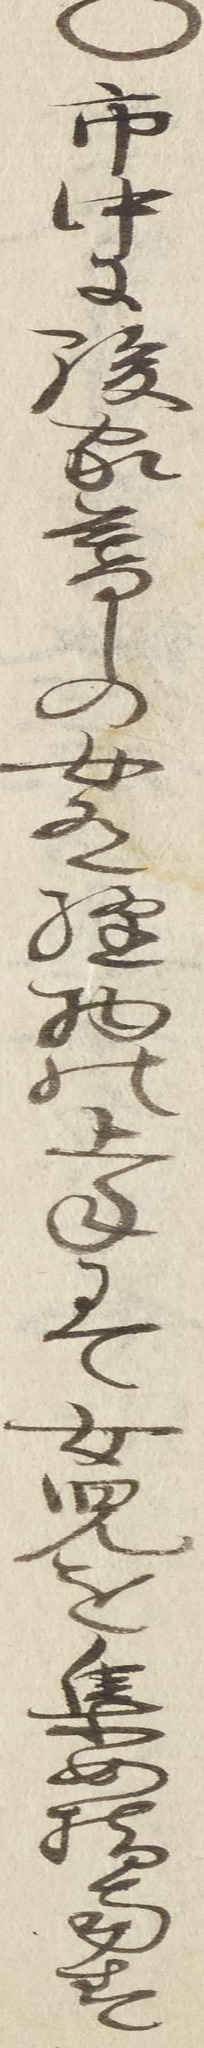○市中に後家暮しの女有縫物の上手にて女児を集め指南す
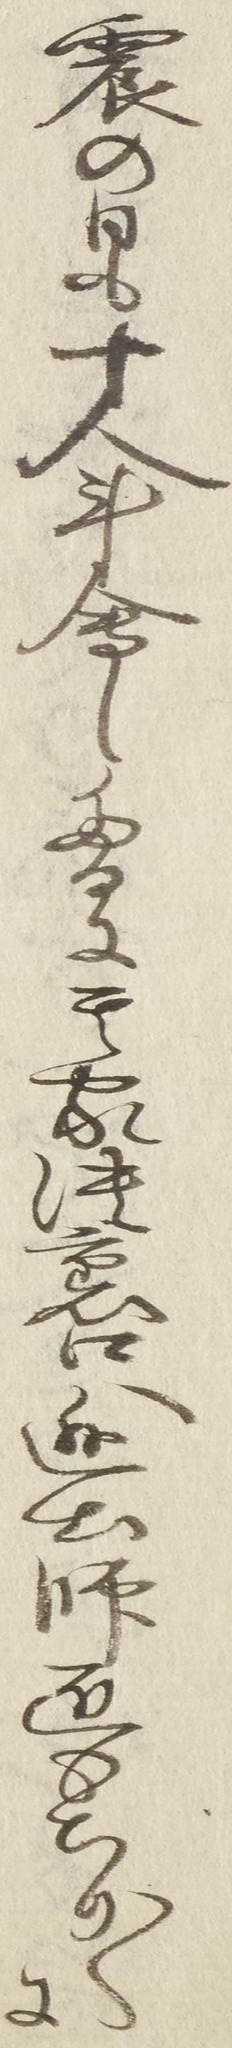震の日も十人斗会したるに其家潰裏口へ逃出師匠もちり〳〵に
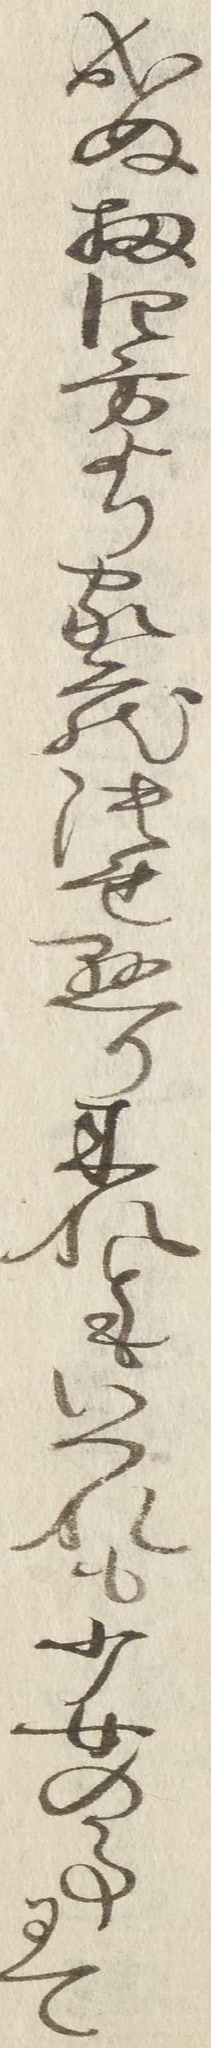成ぬ扨四方より家蔵潰れ懸り来れともいつれも少女の事にて
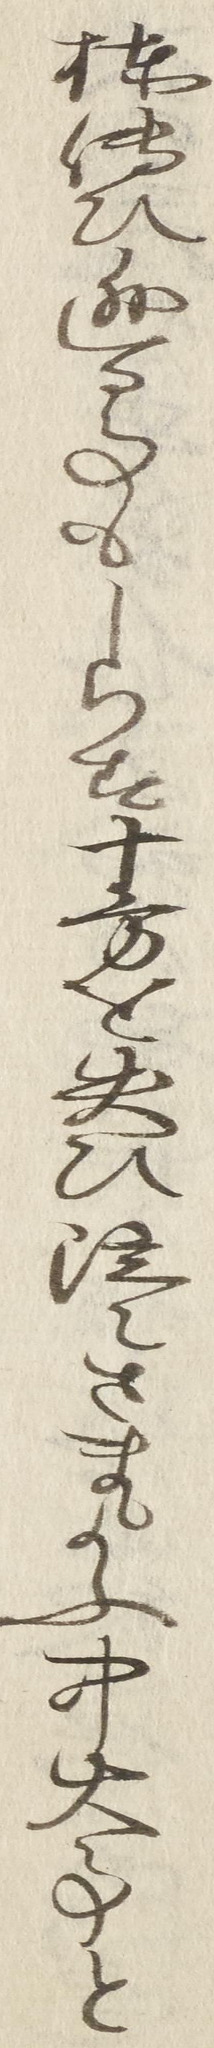棟伝ひ逃る事もしらす十方を失ひ泣々さまよふ中大事と
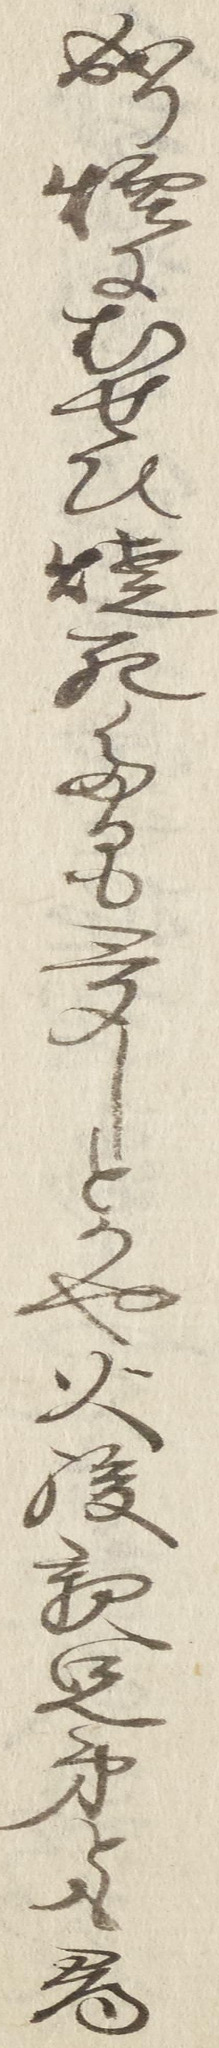成り煙にむせひ焼死たるも多しとかや火後親兄弟とも尋
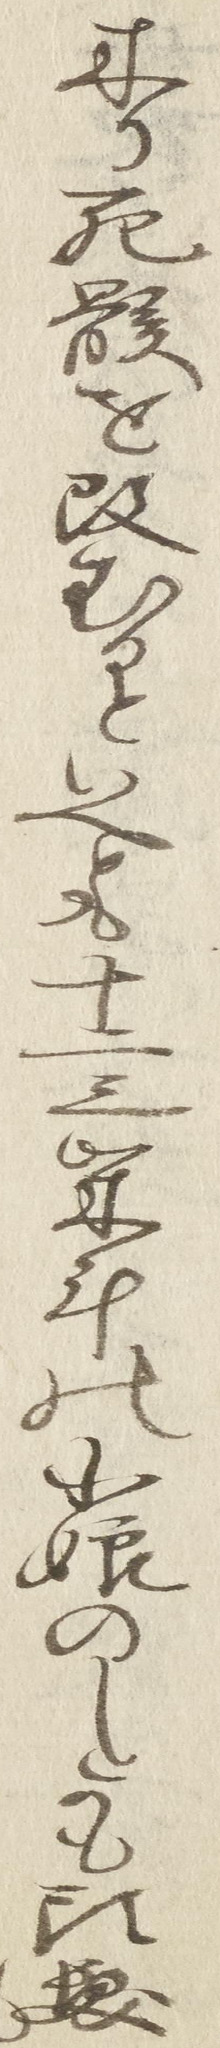来り死骸を改むるといへとも十二三歳斗の小娘のしかも頭髪も
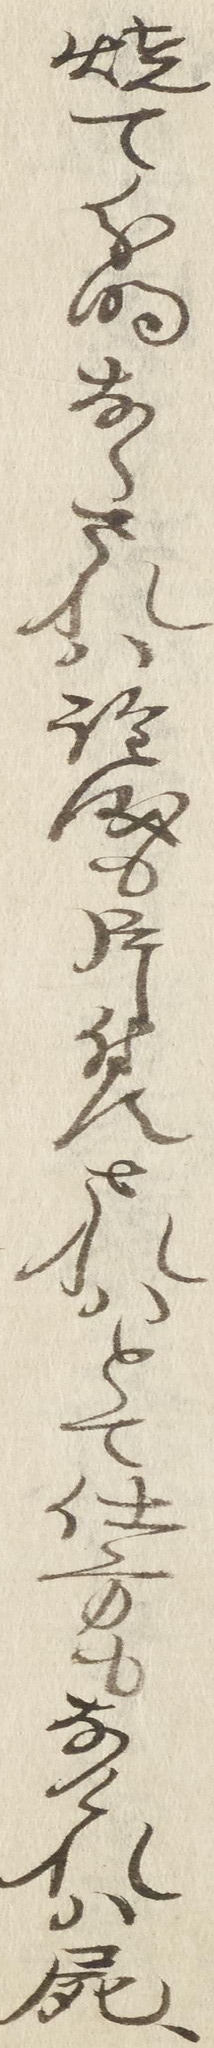焼て分明ならされハ詮議も片付すされハとて仕方もなけれハ屍へ
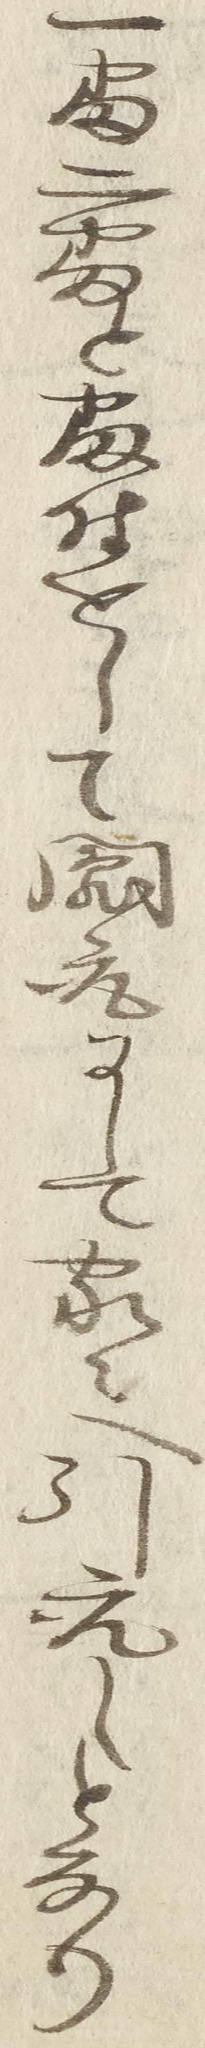一番二番と番付をして鬮取にして家々へ引取しとなり
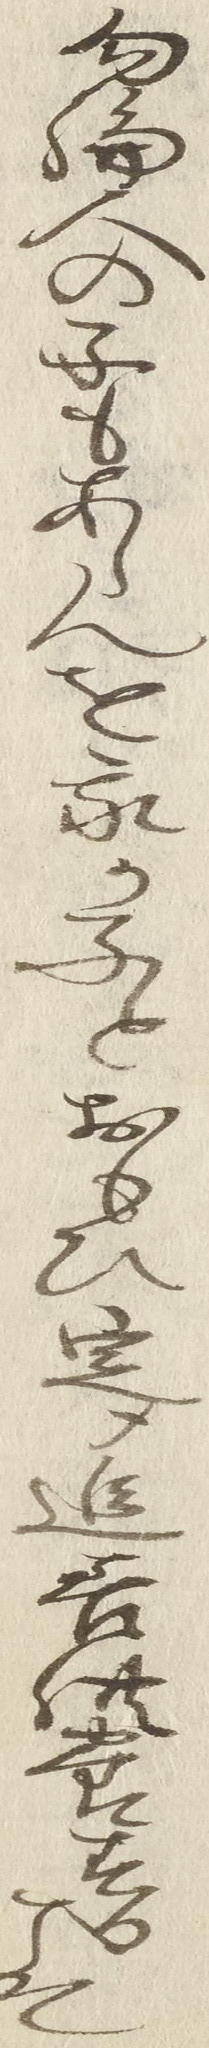勿論人の子もあらんを家の子とおもひ定メ追善供養するこそ
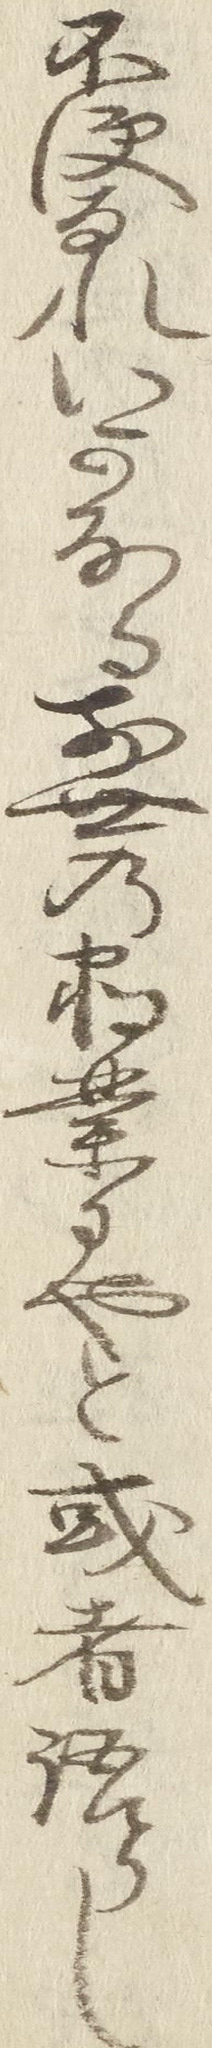不便なれいかなる前世の宿業にやと或者語りし
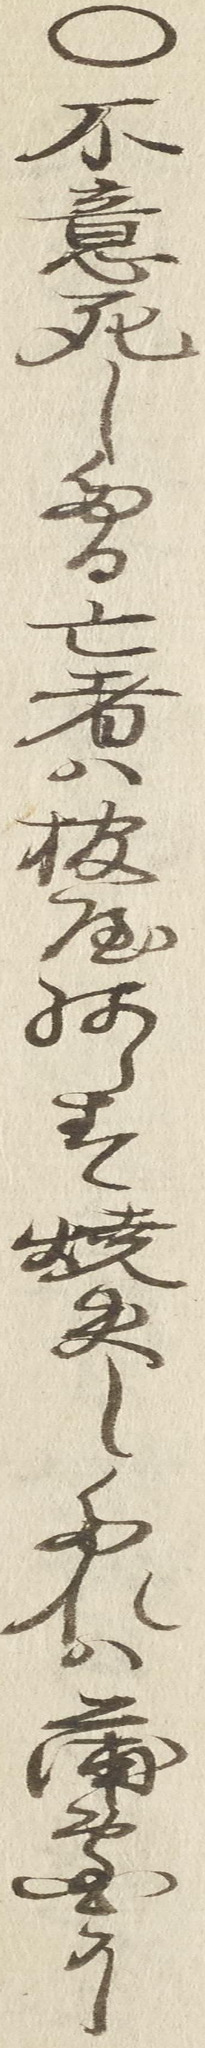○不意死したる亡者ハ棺屋残らす焼失したれハ蒲団に
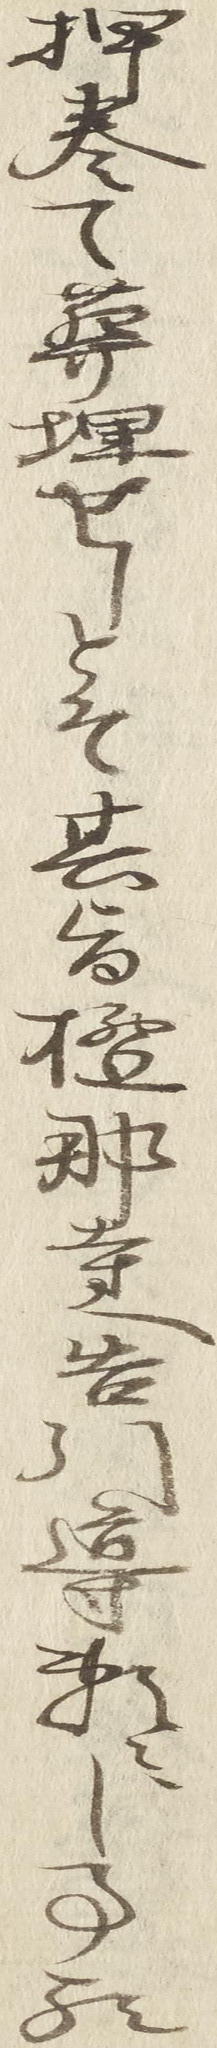押巻て葬埋せしとそ其旨檀那寺へ告引導頼ミし事歟
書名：地震記　上
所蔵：東京大学地震研究所図書室 Earthquake Research Institute Library, The University of Tokyo, JAPAN
